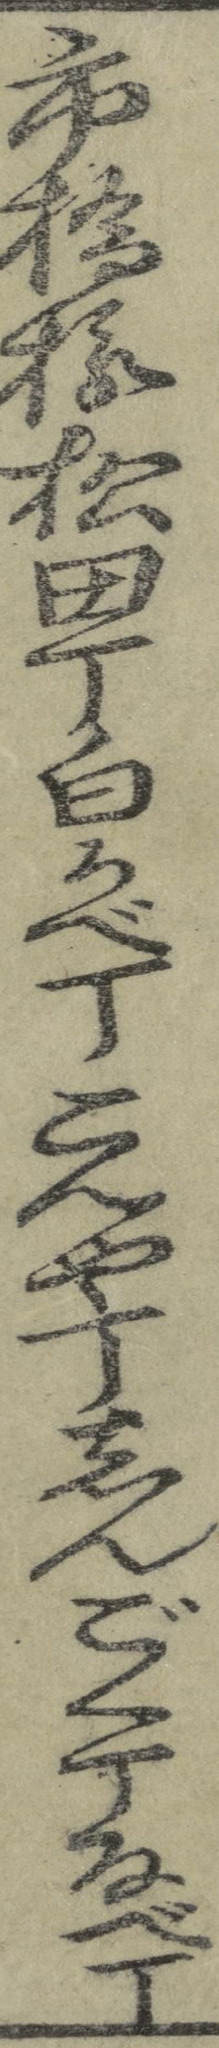市橋様松田丁白かべ丁こんや丁しんごく丁なべ丁
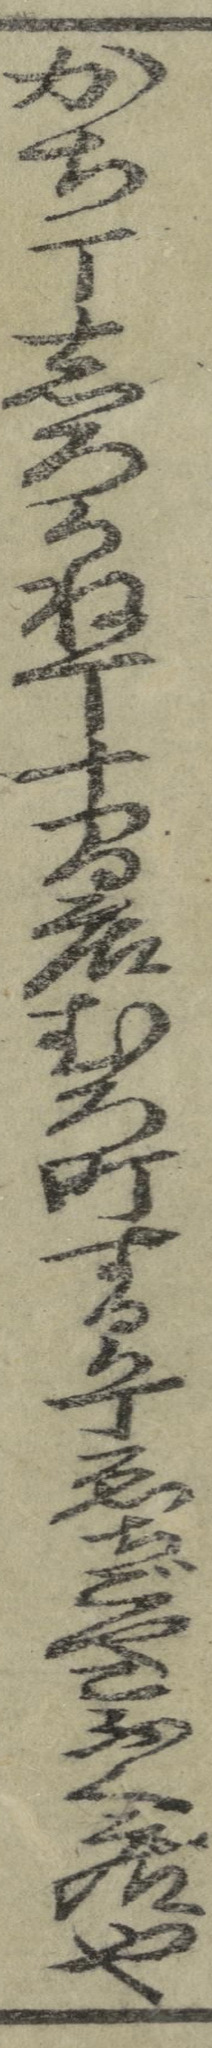かち丁しろかね丁十間店むろ丁するか丁ゑちごやこふく店や
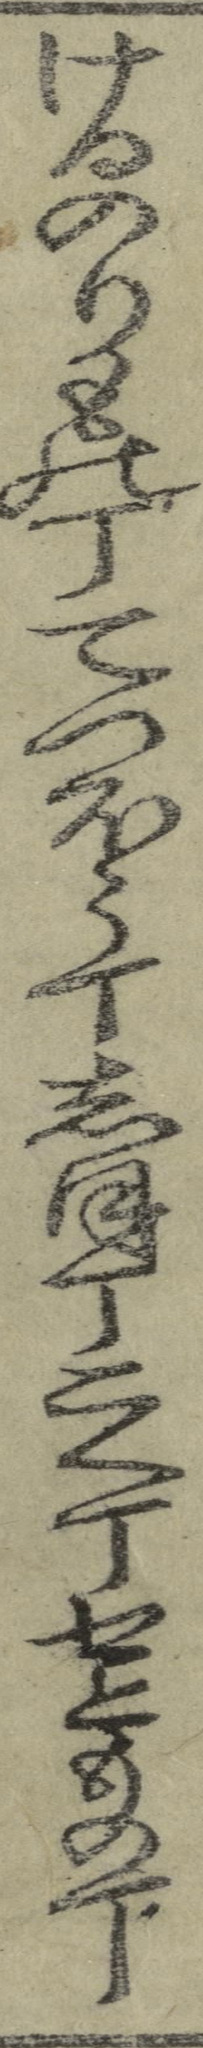けるのりもの丁てつほう丁し月丁こく丁せともの丁
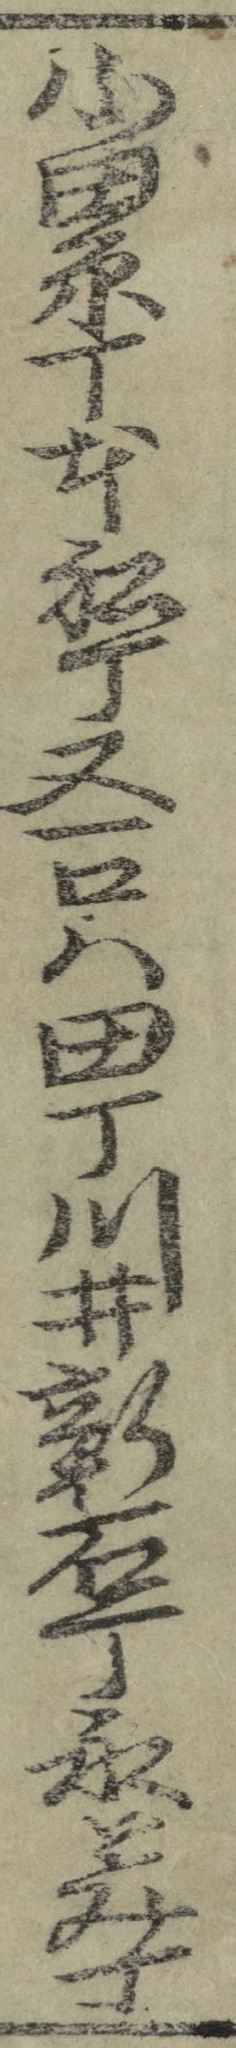小田原丁本船丁又一口は田丁川井新石丁永とみ丁
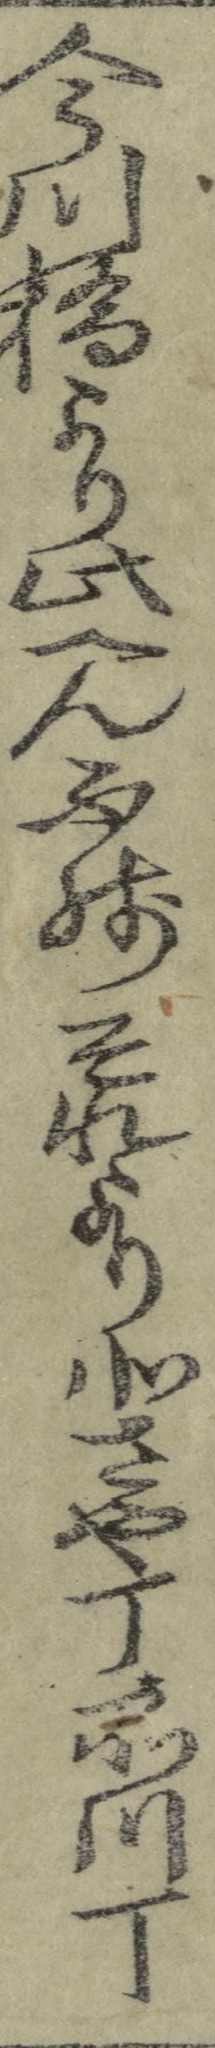今川橋より此へん不残それより北さや丁品川丁
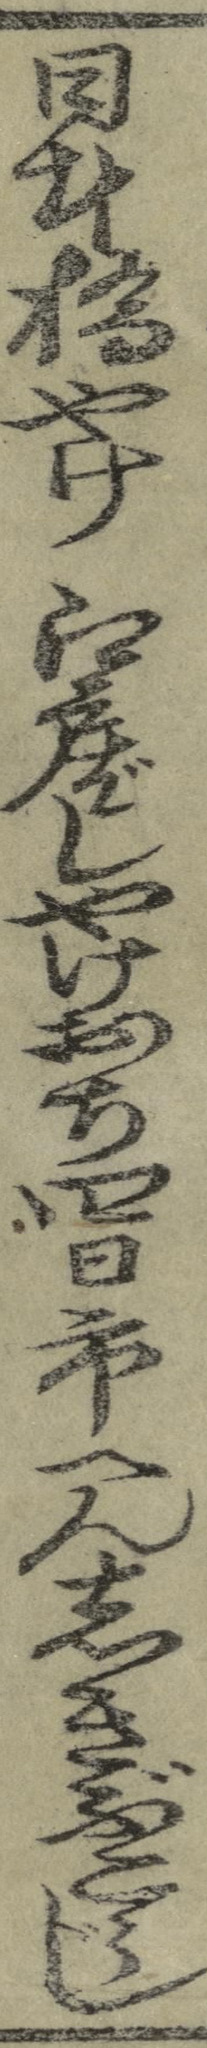日本橋やけ江戸ばしやけおち四日市へんしきぶこうじ
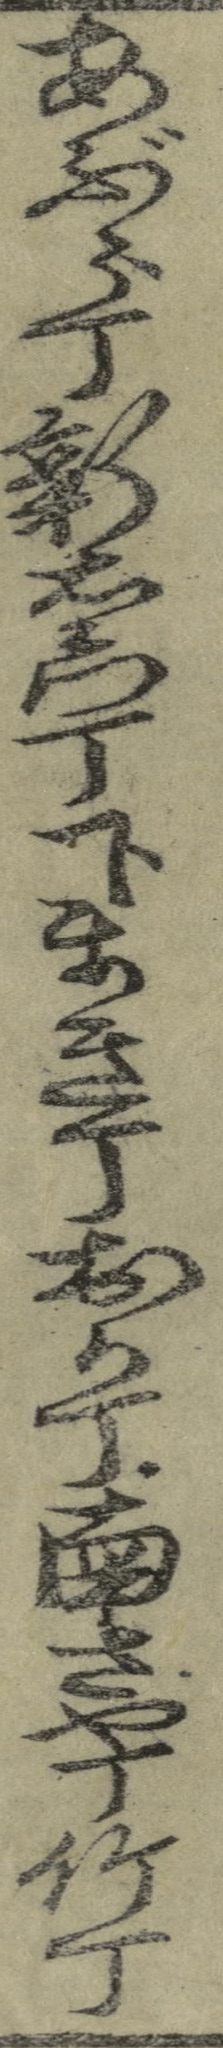あぶら丁新右衛門丁下まき丁おか丁南さや丁竹丁
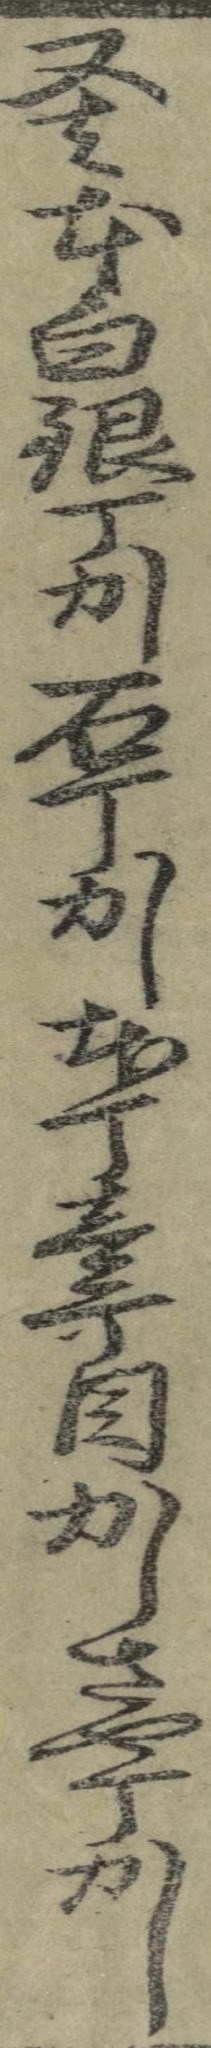又其本白銀丁かし石丁かし本丁壱丁目かしさや丁かし
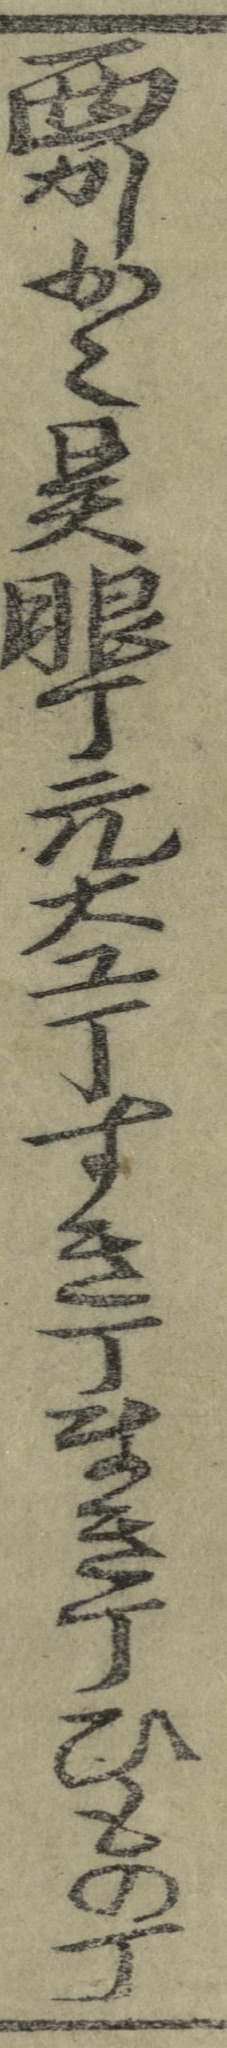西かし少〻呉服丁元大工丁すき丁まき丁ひもの丁
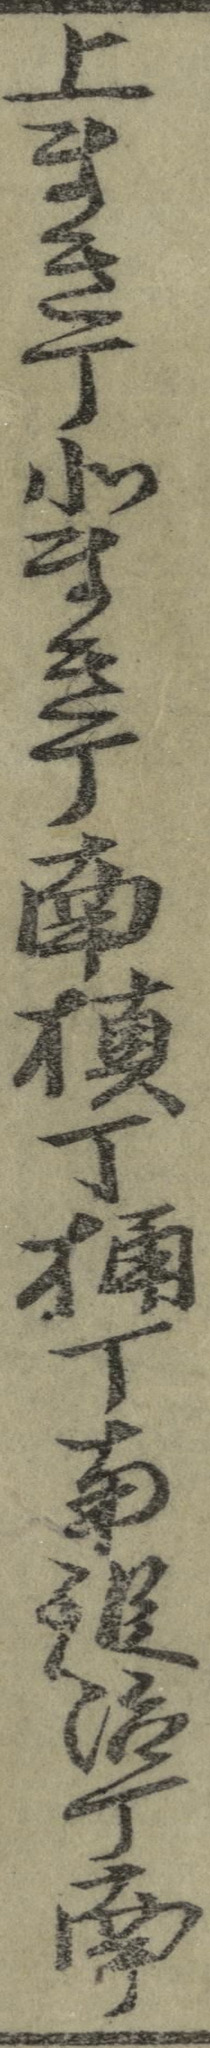上まき丁北まき丁南槙丁桶丁南鍛冶丁南
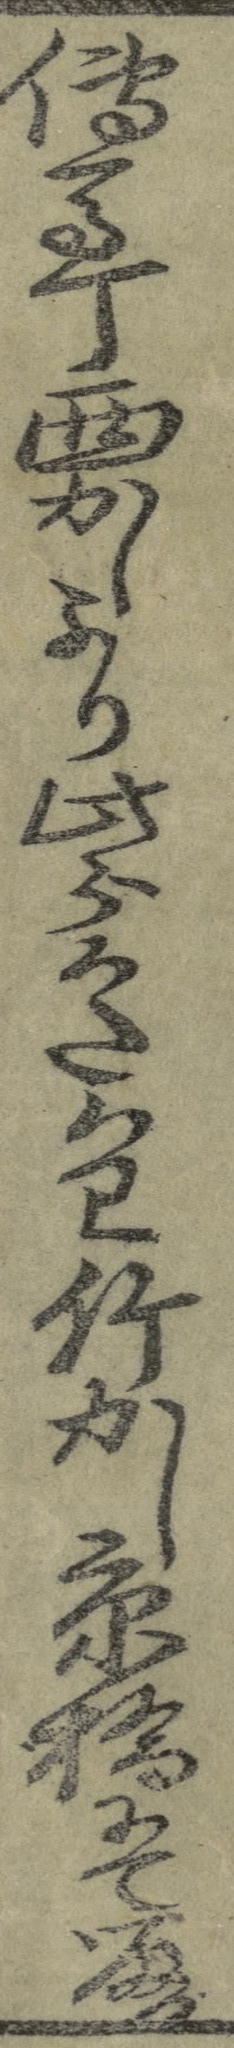伝馬丁西かしより此分かたかわ竹かし京橋にて留る
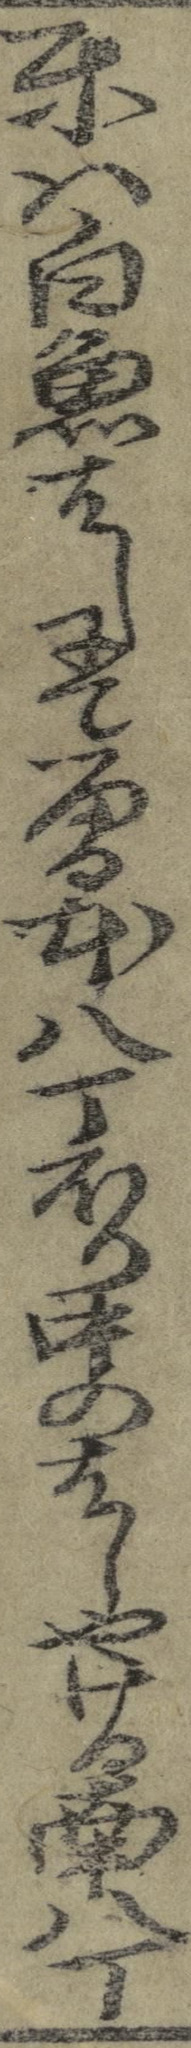東は白魚はしにて留る本八丁ほり中のはしやける南八丁
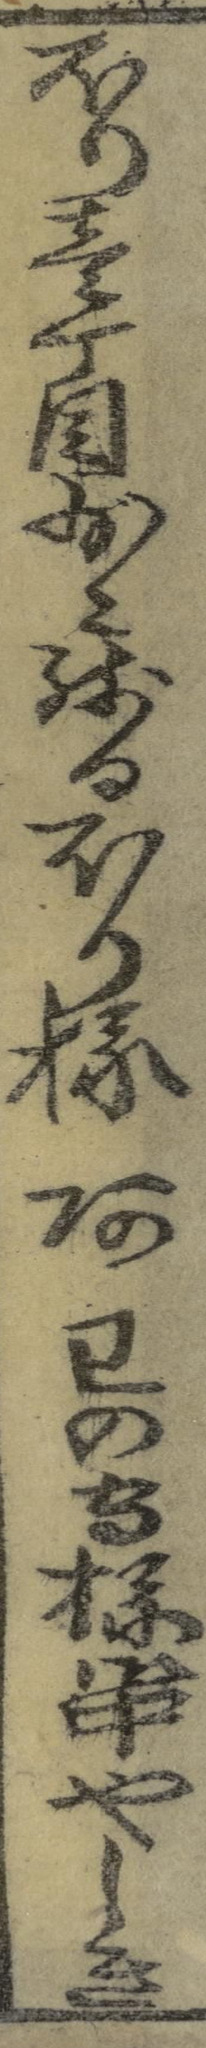ほり壱丁目少〻残るほり様あわの守様御中やしき
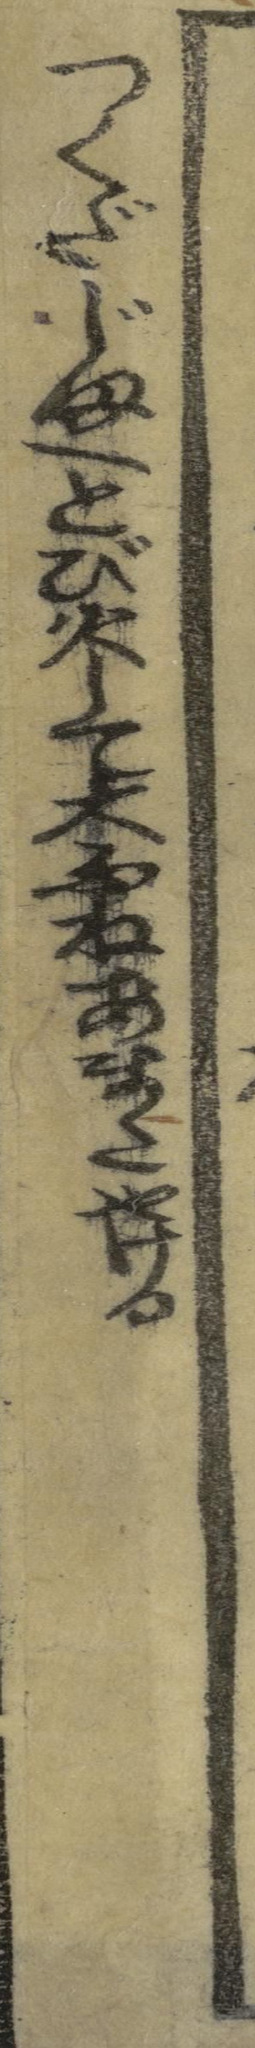つくだじまへとび火して木ふねあまたやける
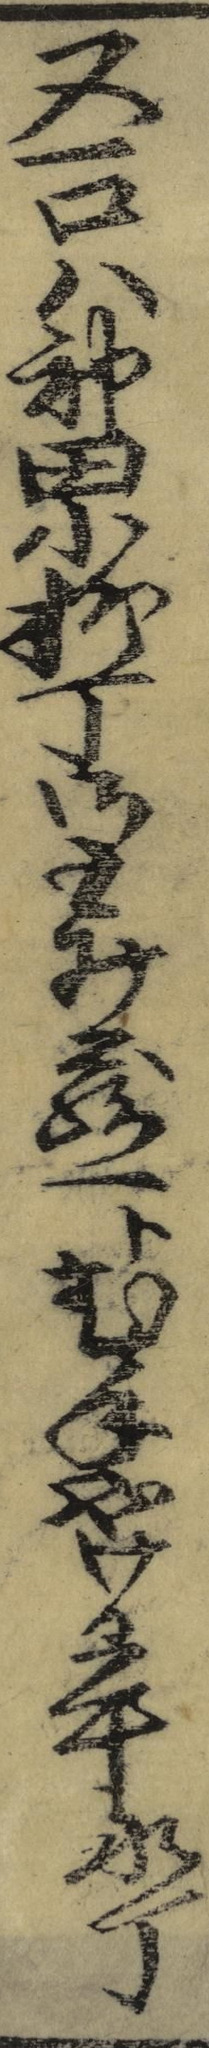又一口は神田小柳丁御もみ蔵一トむねやける平永丁
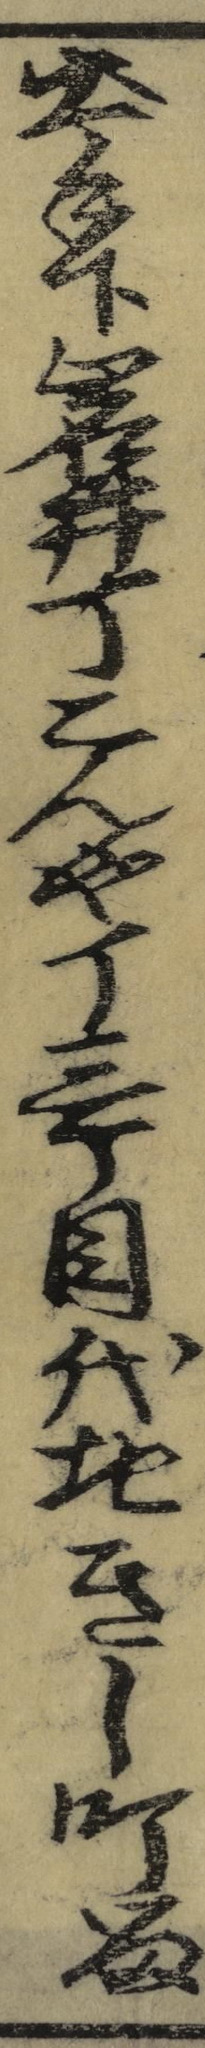土手下岩井丁こんや丁三丁目代地きし町冨
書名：[弘化三年一月の江戸大火に関する瓦版]
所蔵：東京大学地震研究所図書室 Earthquake Research Institute Library, The University of Tokyo, JAPAN
